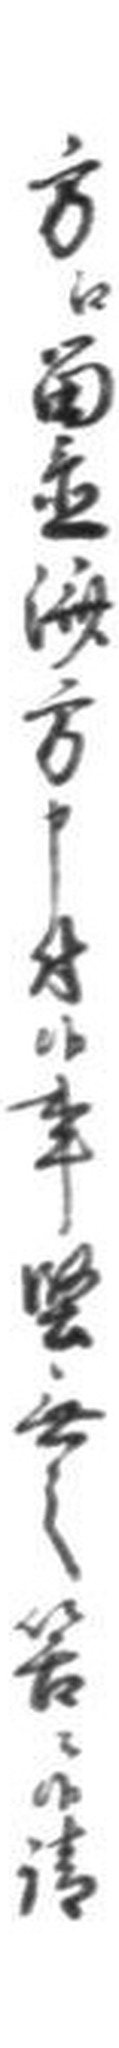方江留置済方申付候事堅無之筈ニ候請

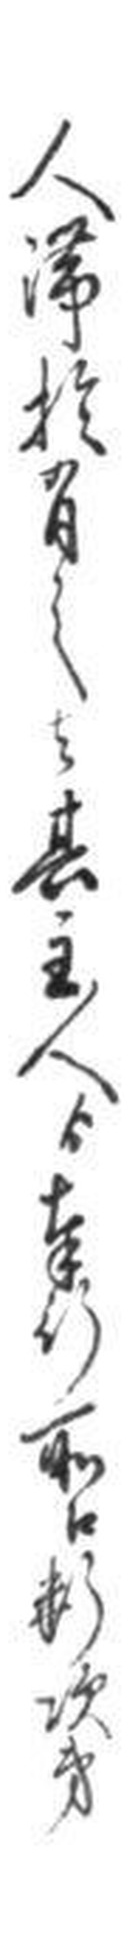人滞於有之者其主人ゟ奉行所江断次第
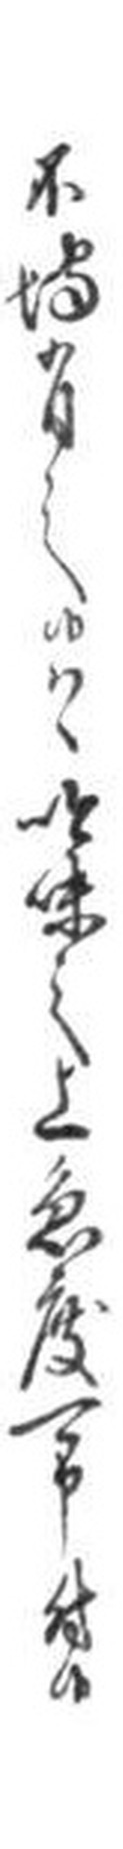不埒有之候ハヽ吟味之上急度可申付候
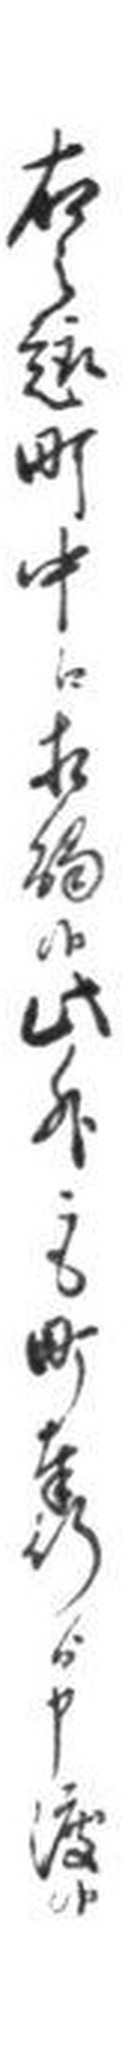右之趣町中江相触候此外ニも町奉行ゟ申渡候
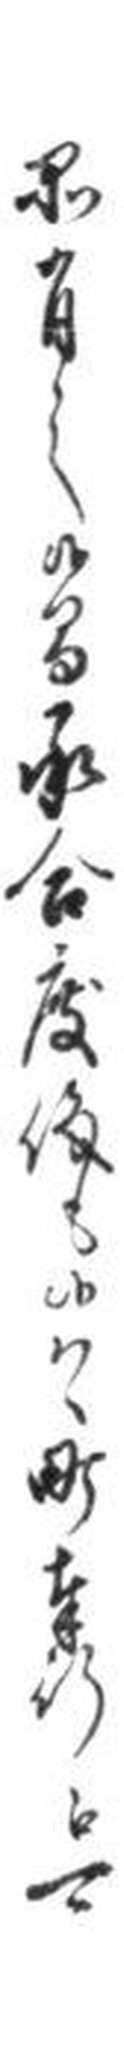品有之候間承合度儀も候ハヽ町奉行江可
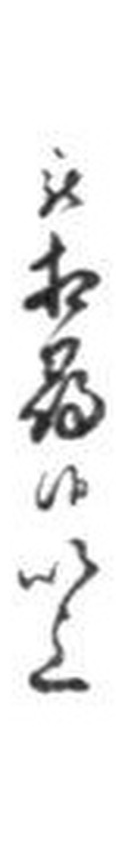被相尋候以上
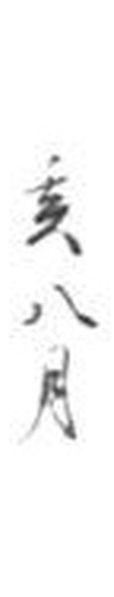亥八月
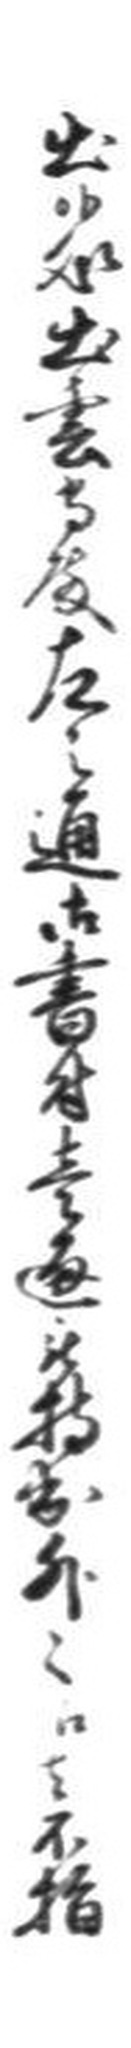出候処出雲守殿左之通御書付壱通被持出外々江者不指
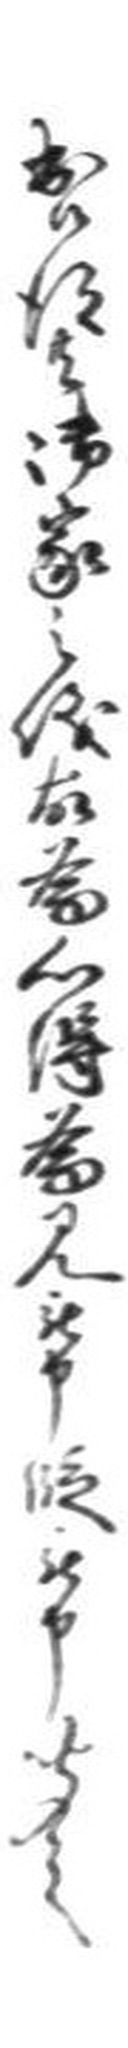出候得共御家之儀故為心得為見被申段被申聞之
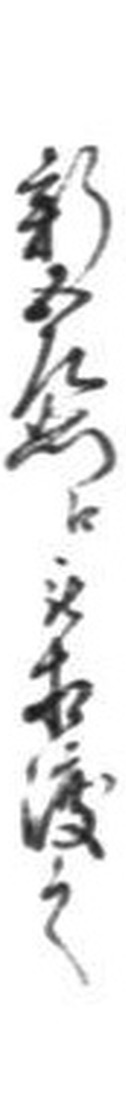新五左衛門江被相渡之
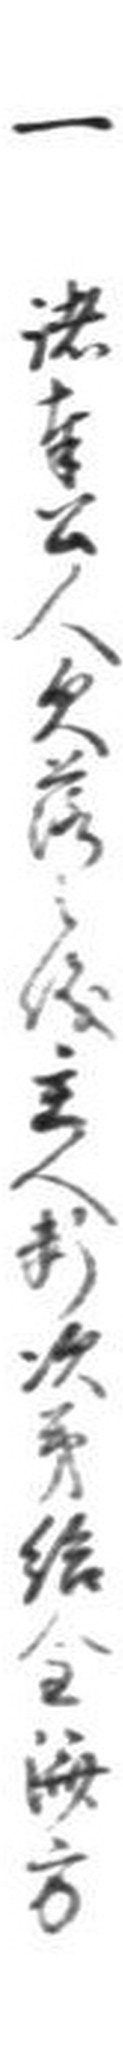一諸奉公人欠落之儀主人断次第給金済方
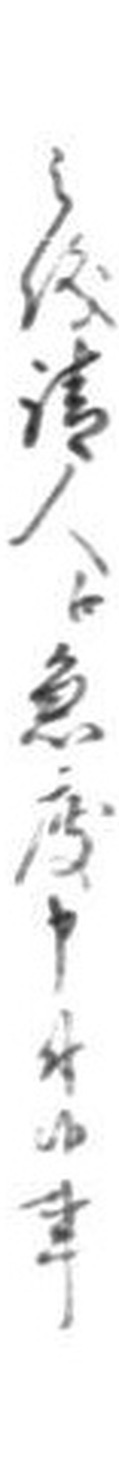之儀請人江急度申付候事
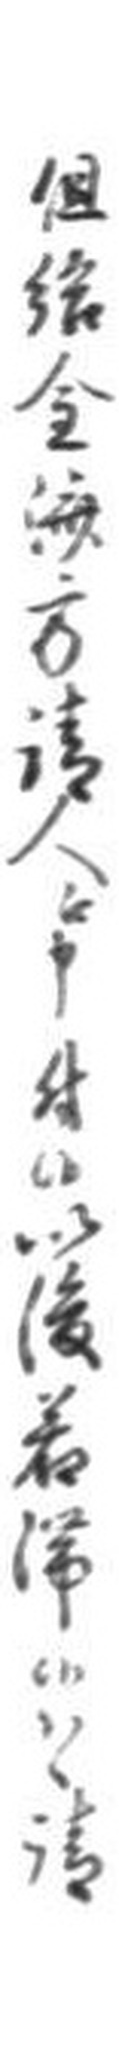但給金済方請人江申付候以後若滞候ハヽ請
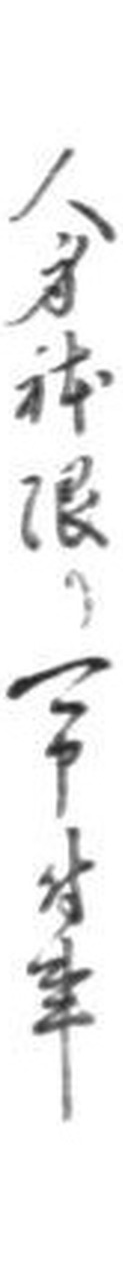人身体限り可申付事
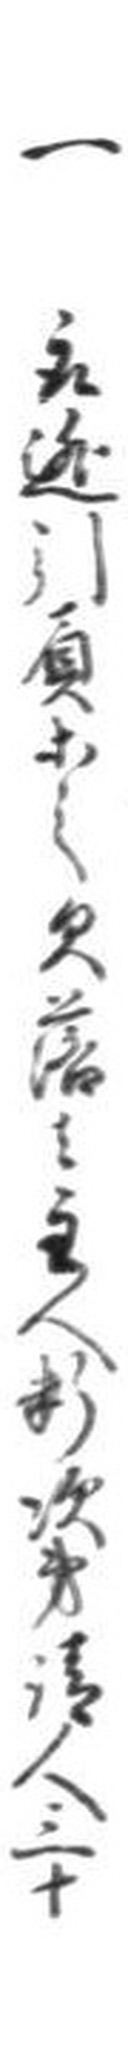一取逃引負等之欠落者主人断次第請人三十
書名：家譜 三十三 吉邦公 享保四年
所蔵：福井県文書館 Fukui Prefectural Archives
